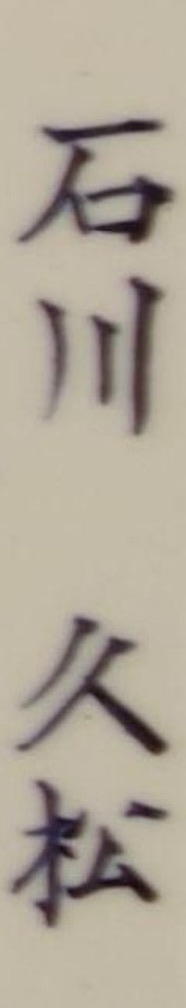石川久松
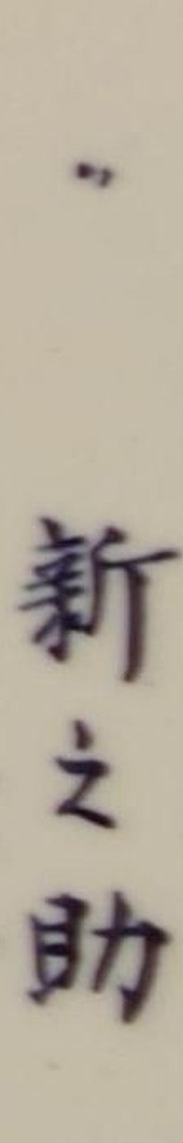新之助
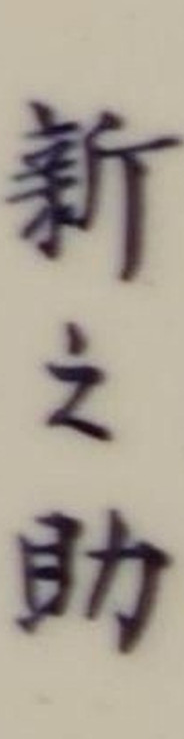新之助
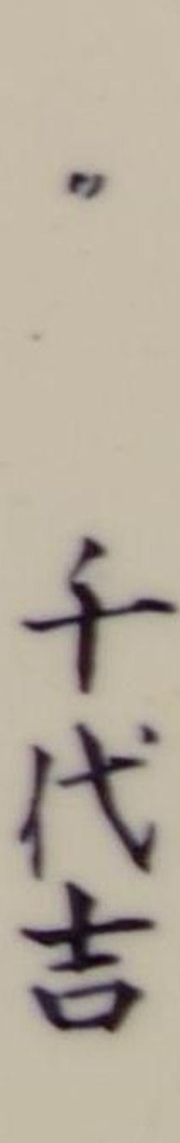千代吉
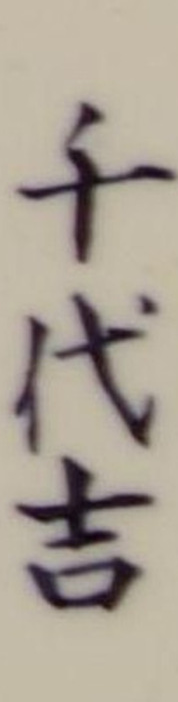千代吉
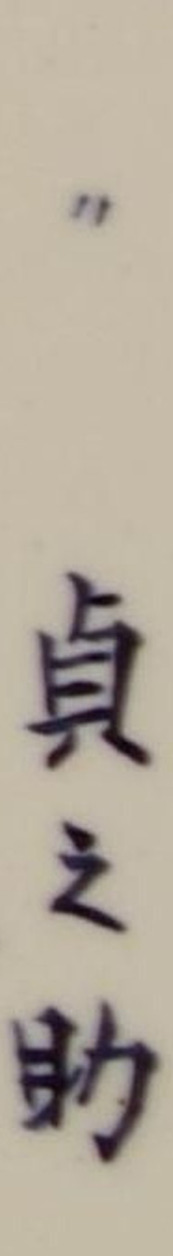貞之助
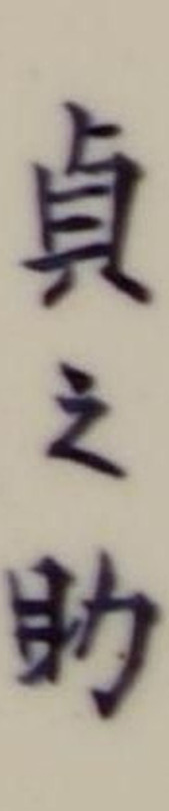貞之助
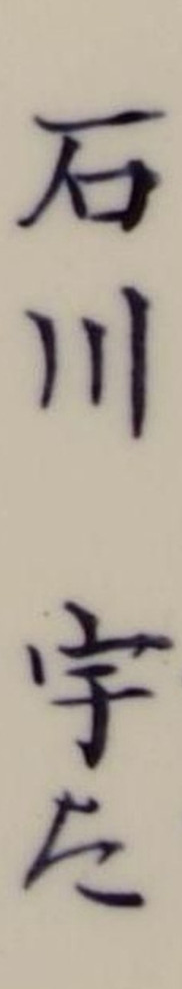石川宇太
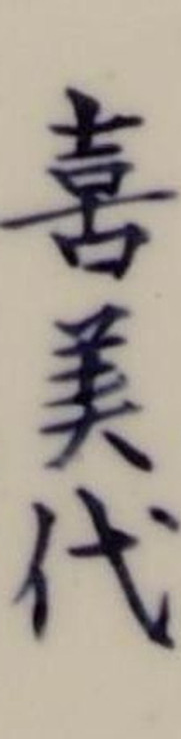喜美代
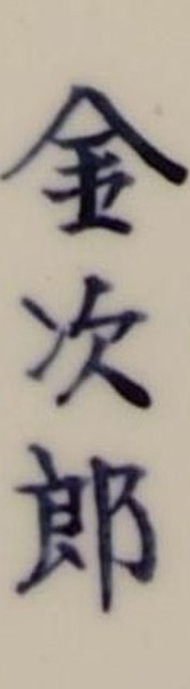金次郎
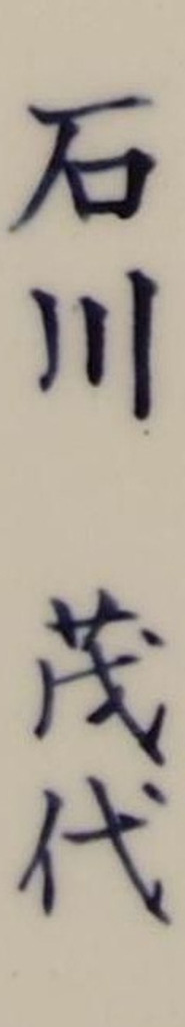石川茂代
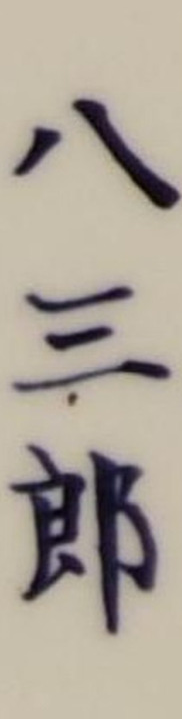八三郎
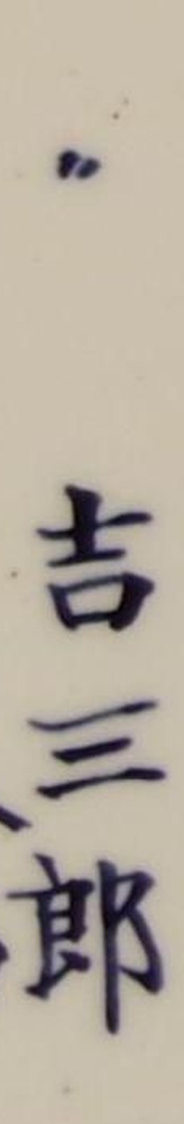吉三郎
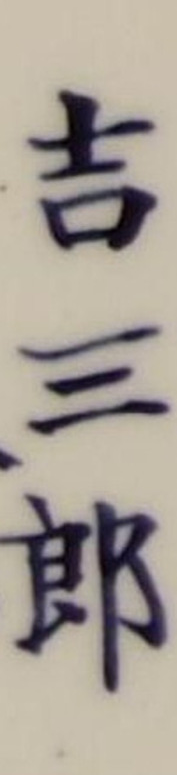吉三郎

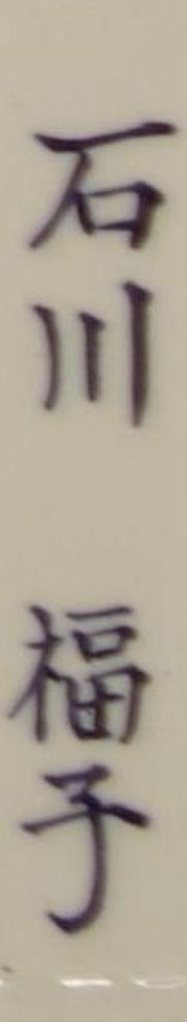石川福子
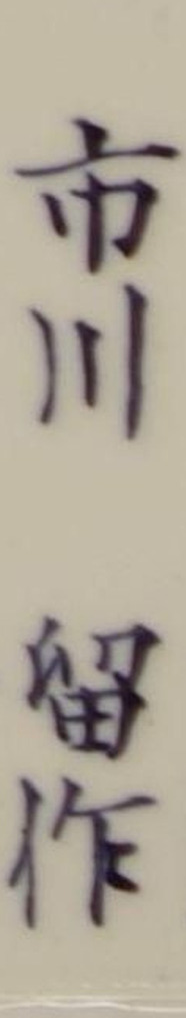市川留作
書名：M~S
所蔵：高野山金剛峯寺
